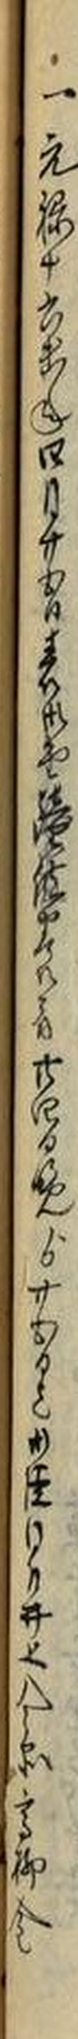一元禄十六未年四月廿五日表御堂鐘供養に付廿四日晩ゟ廿五日迄御徒目付井上八兵衛高柳金
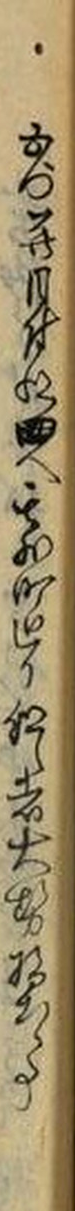五右衛門并目付組四人其外町廻り組之者大勢指出候事
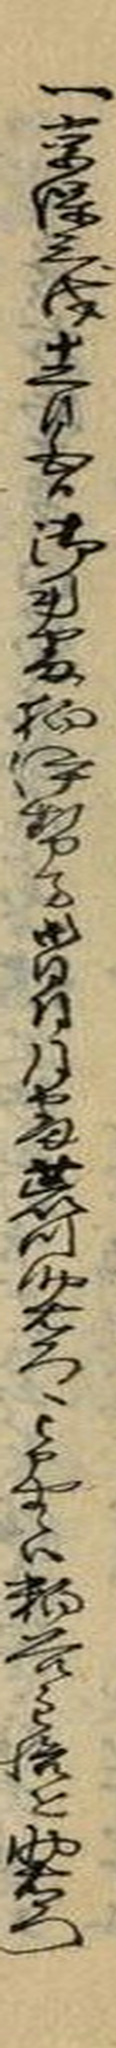一享保三戌十二月五日御用番狛伊勢方御目付月番荒川助右衛門へ被申聞候は粕谷主膳を助右衛門
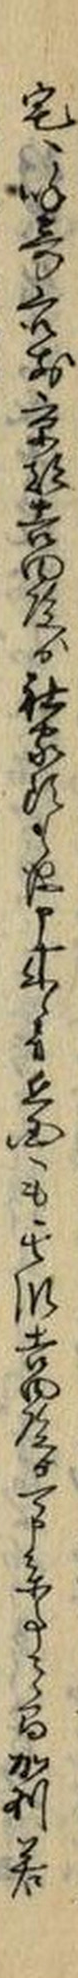宅へ呼寄最前京都吉田殿ゟ社家頭之儀申来候に付近国へも其段吉田殿ゟ可申参事に候間加州若
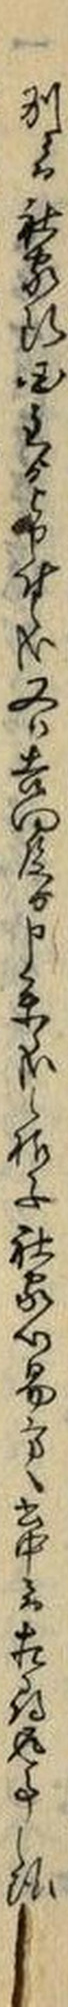州にて社家頭国主ゟ被申付候哉又は吉田殿ゟ申参候哉之様子社家心易方へ書中にて相尋返事之趣
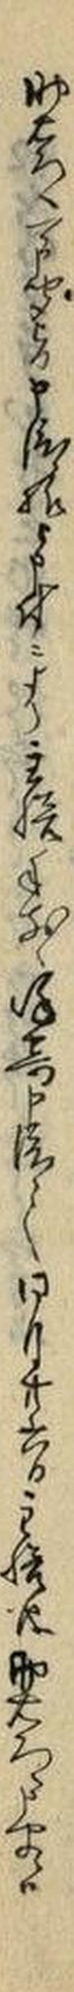助右衛門へ可申聞旨申渡候様被申付により主膳手前へ呼寄申渡之同月廿六日主膳儀助右衛門へ申聞候は
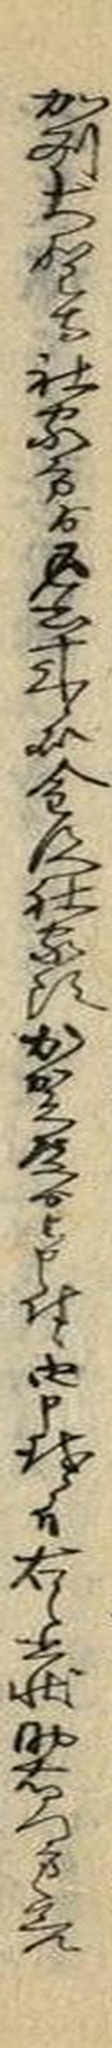加州大聖寺社家方ゟ返書来候処金沢社家頭加賀殿ゟ被申付候由申越候に付右之書状助右衛門方へ差
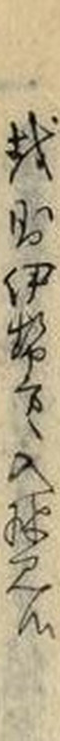越則伊勢方へ入披見候
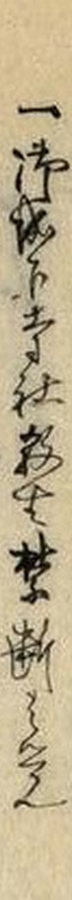一御城下寺社殺生禁断之覚
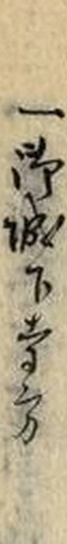一御城下寺方

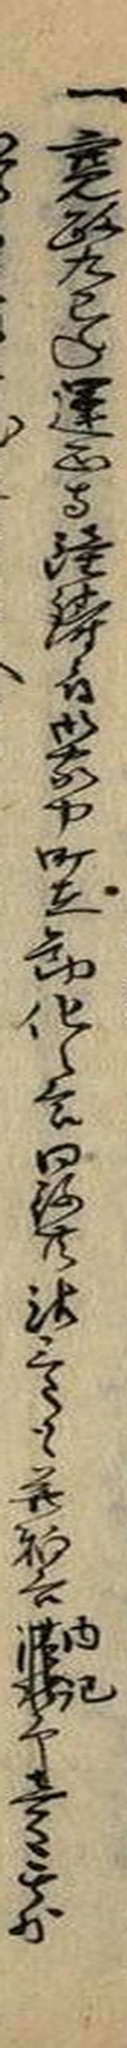一寛政九巳年運正寺鐘鋳に付御家中町在勧化之節同役共銀三匁ツヽ并粕谷内記壱匁其外
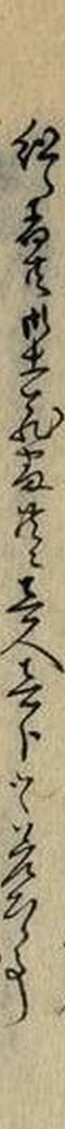組之者共御土蔵番共に壱人壱分ツヽ差出候事
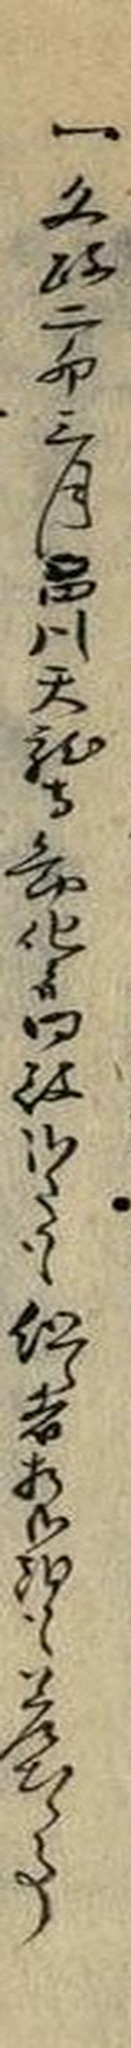一文政二卯三月品川天龍寺勧化に付同役弐匁ツヽ組之者拾弐銅ツヽ差出候事
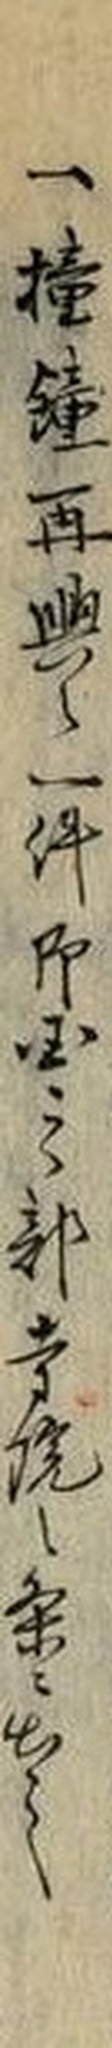一撞鐘再興之一件御国之部寺院之条に出之
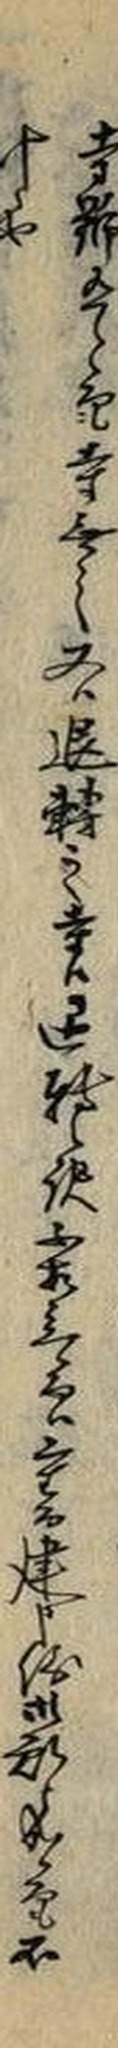寺号有之候ても寺無之又は退転之寺は退転之訳不相立候ては重て建申儀御願被成候ても不
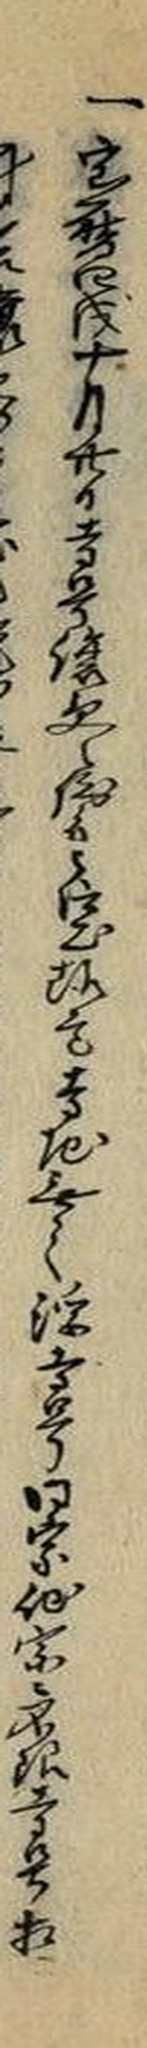一宝暦四戌十月廿日寺号譲受之儀に付被仰出趣意寺地無之浮寺号同宗他宗に不限寺号相
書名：御城下諸事之部
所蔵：福井県文書館 Fukui Prefectural Archives
